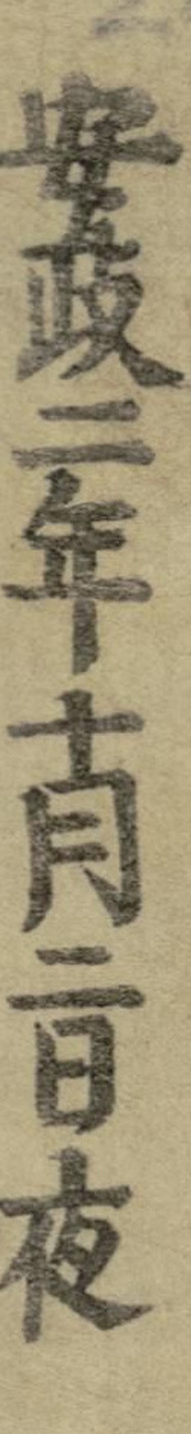安政二年十月二日夜
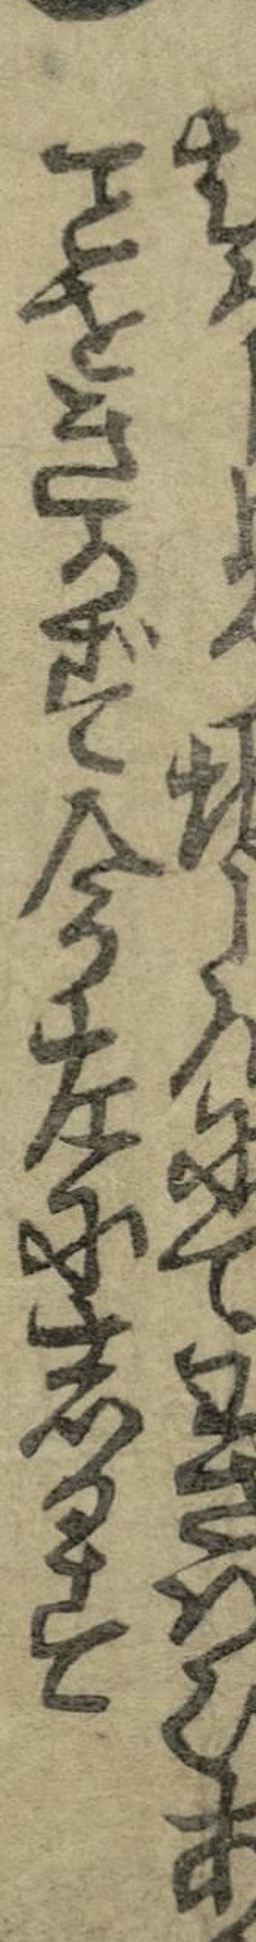ことをきかず今左にしるす
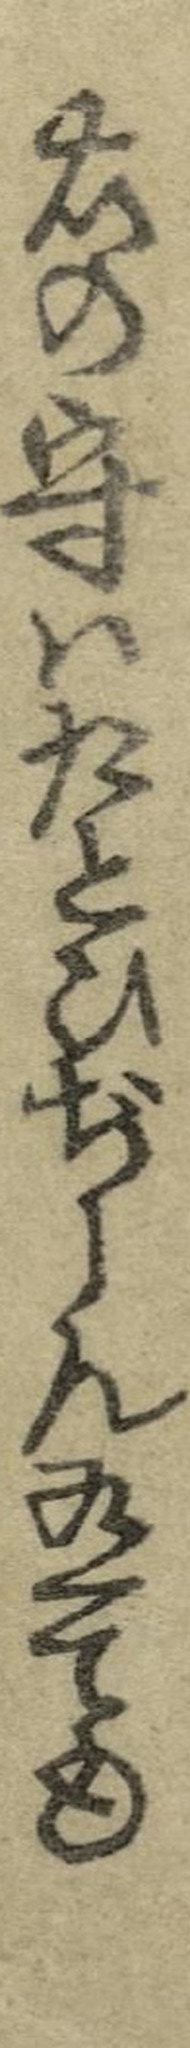右の守はたとひぢしん有ても
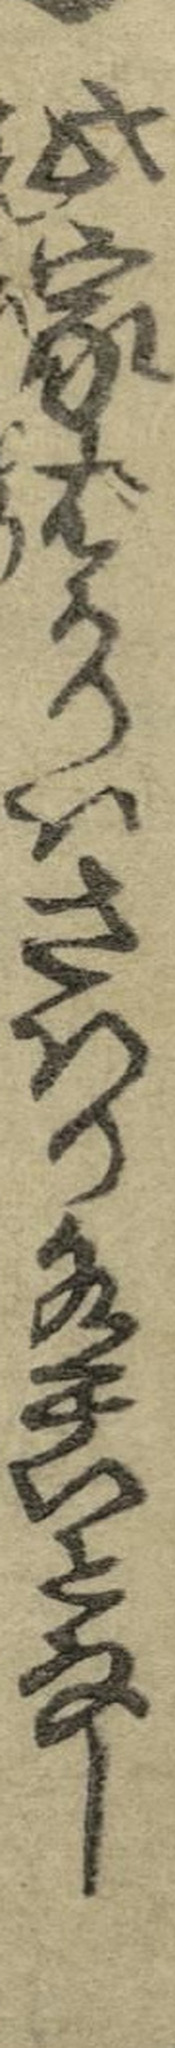此家ばかりいさはり有ことなし
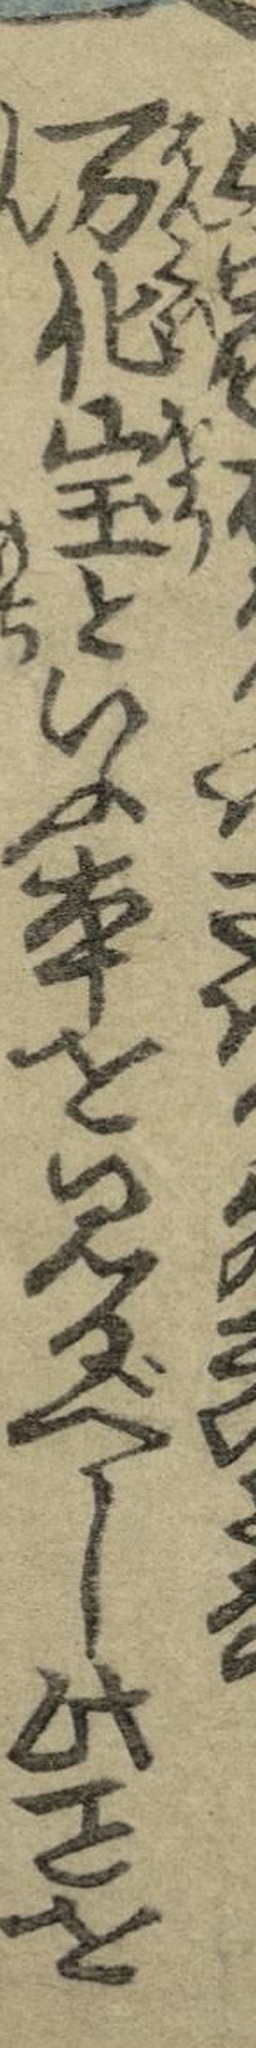万化宝といふ本を見るべし此ことを
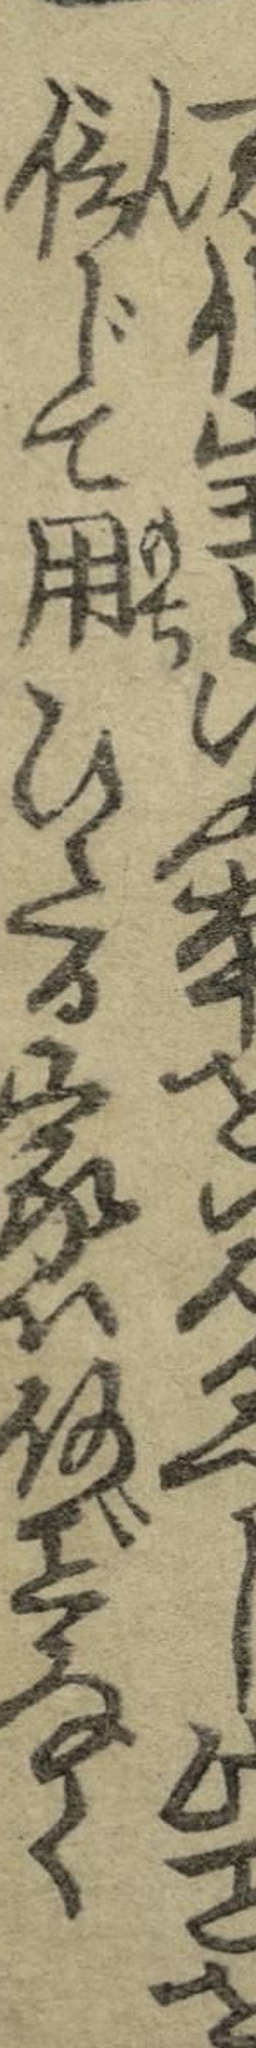信じて用ひたる家は何ごとなく
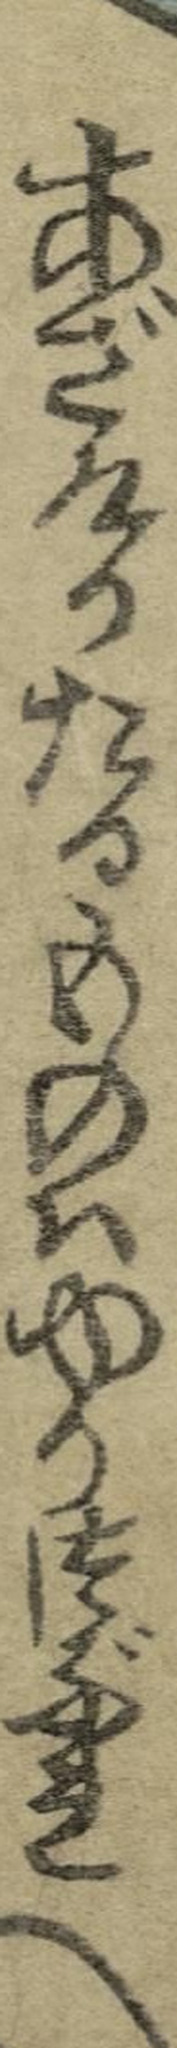あざけりたるものはゆりつぶれ
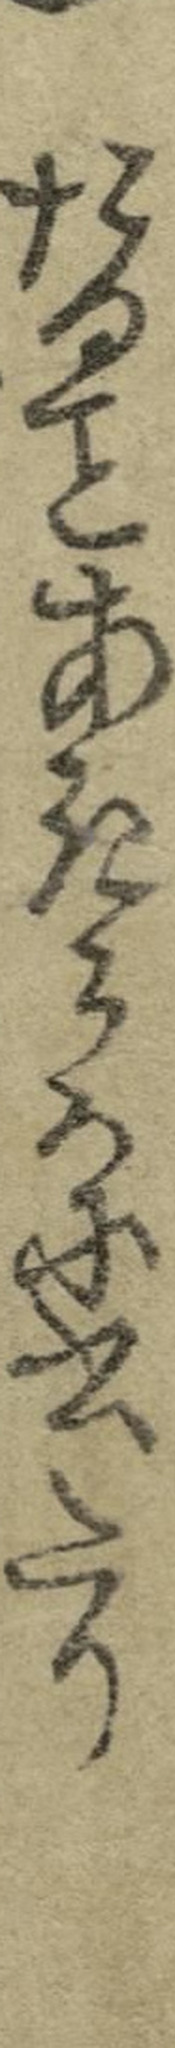たることあきらかに云たり
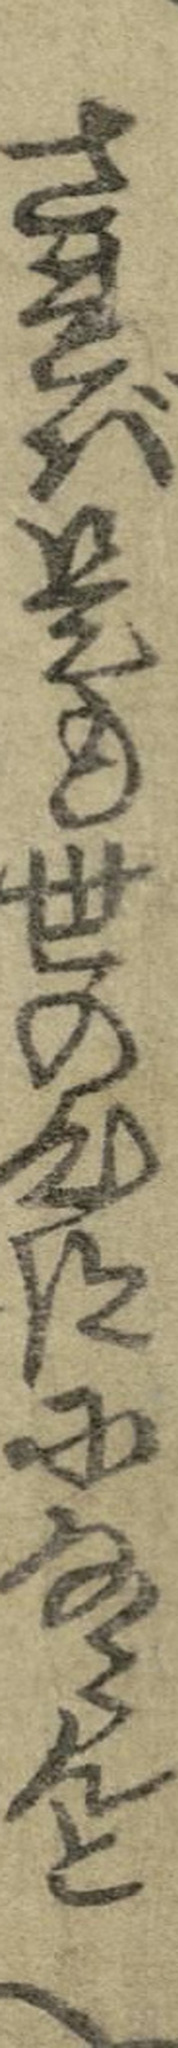されば是も世の心得にならんと
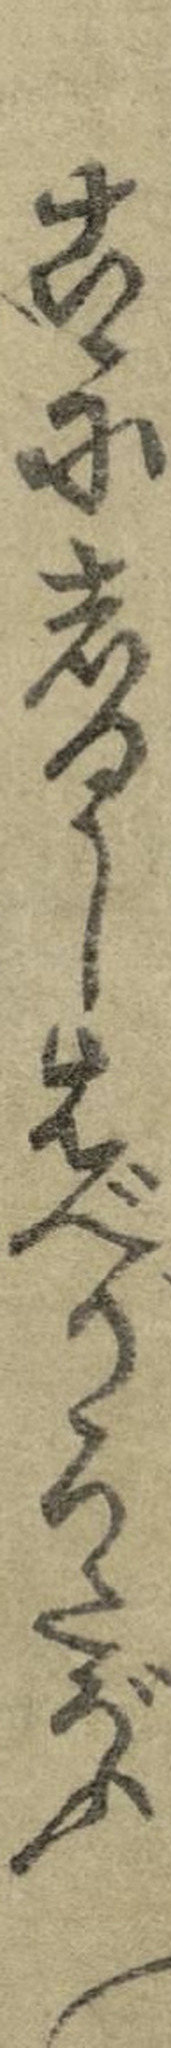こゝにしるしはべりうたがふ
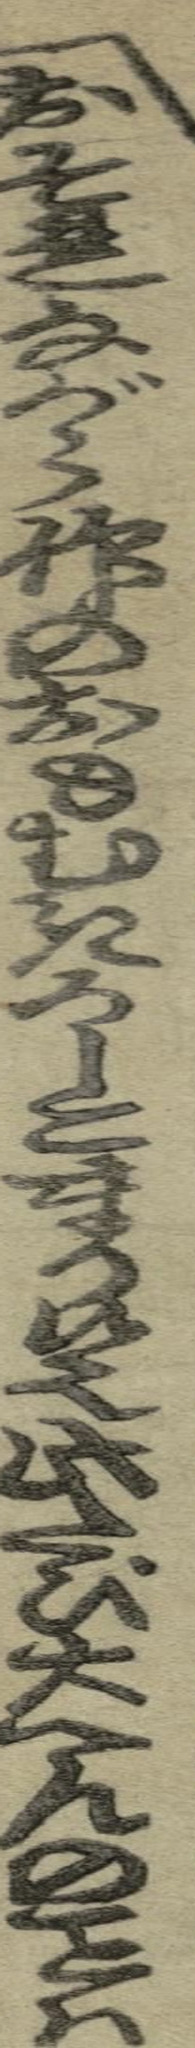〽おそれながら仰のおもむきかしこまり候也此たび大へんのことは
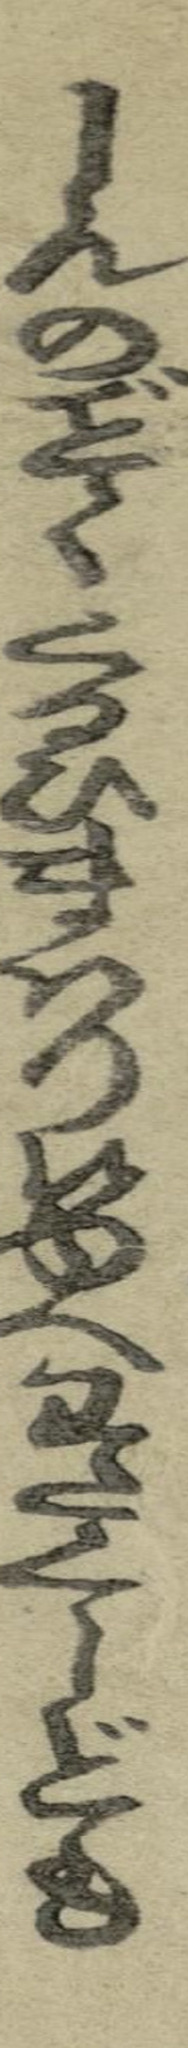しんのごとくくるひまはり候ゆへわたくしども
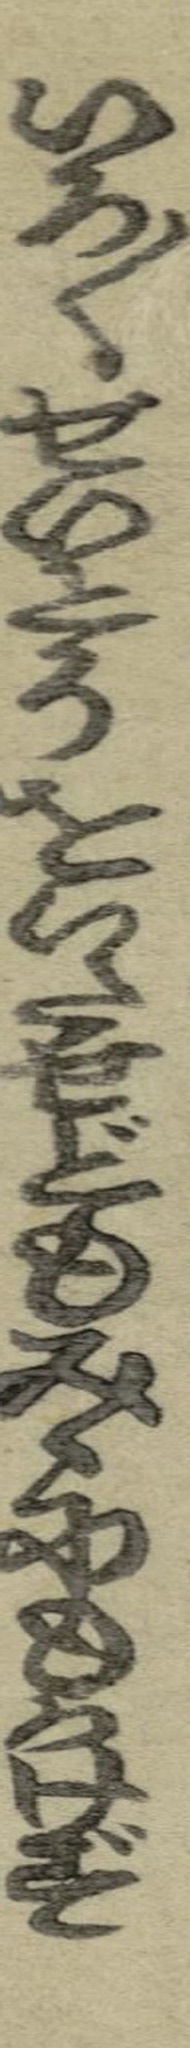いろ〳〵せいとうをいたせどもみゝにもかけず
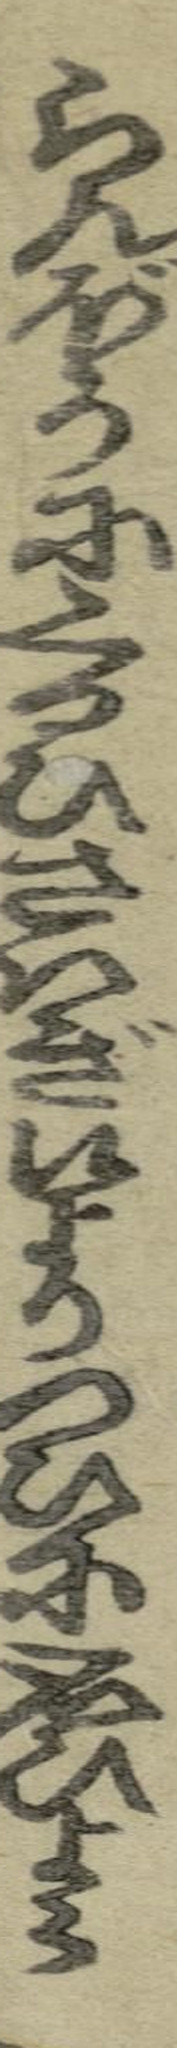らんぼうにくるひさはぎ候よりつひに不ひよう
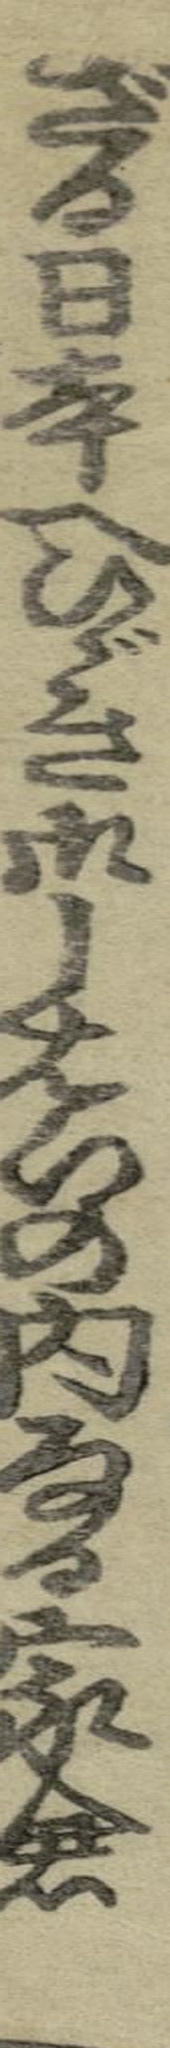ざる日本へひゞき御しはいの内なる家倉
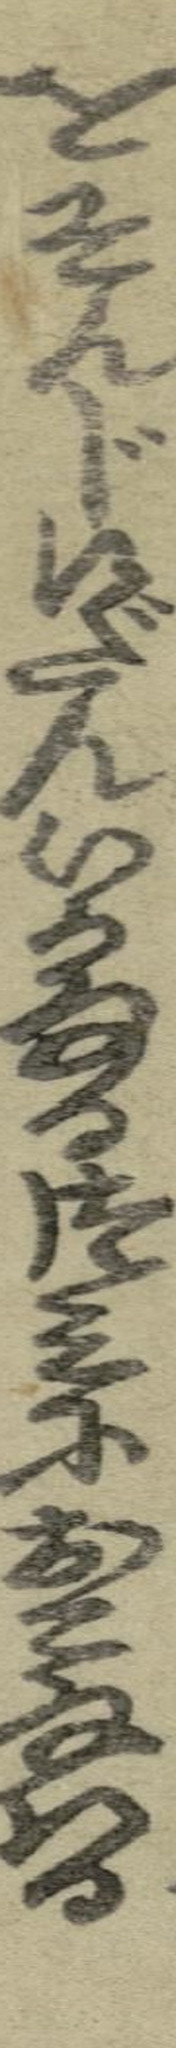をそんじ候だんいかなるつみにおこなはる
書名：自身除妙法
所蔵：東京大学地震研究所図書室 Earthquake Research Institute Library, The University of Tokyo, JAPAN
